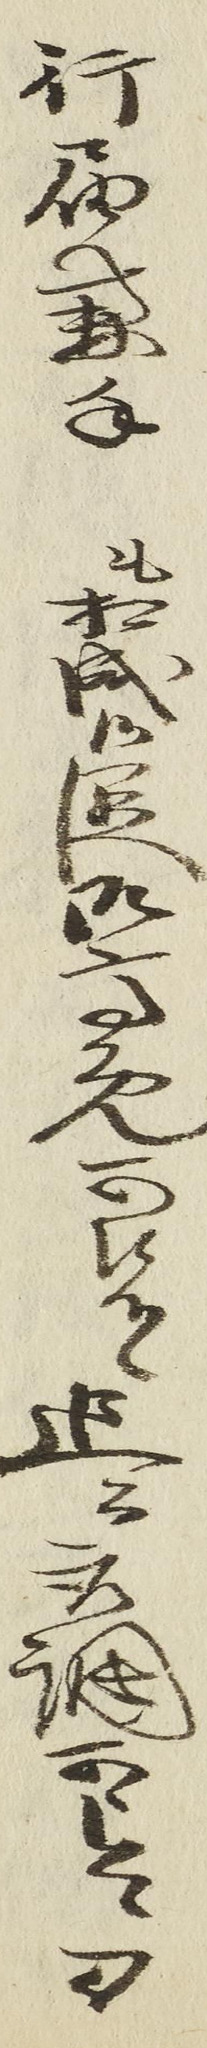行届兼手も二相成候段御高免可被下候追而取調可申上候以上

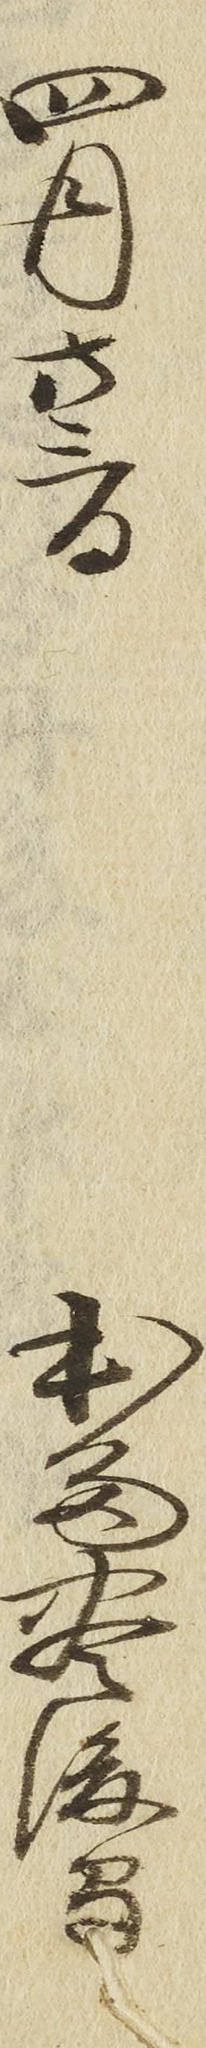四月廿三日本多豊後守
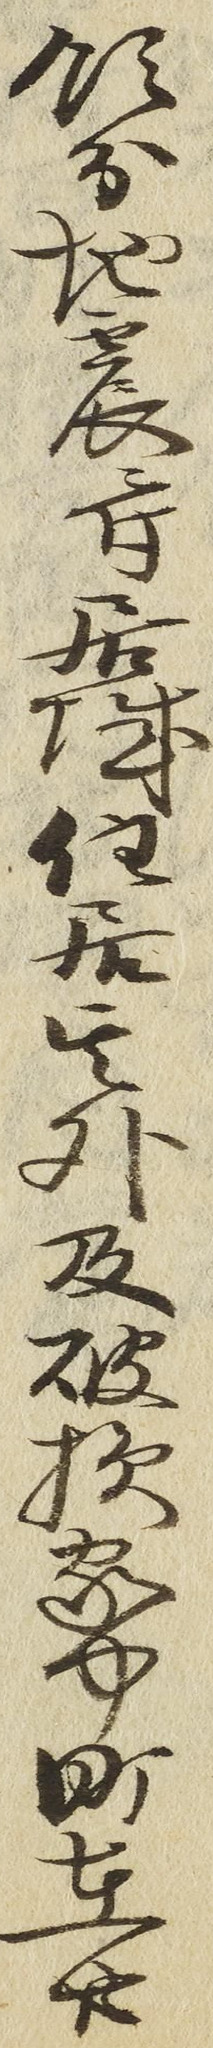領分地震二付居城住居其外及破損家中町在共
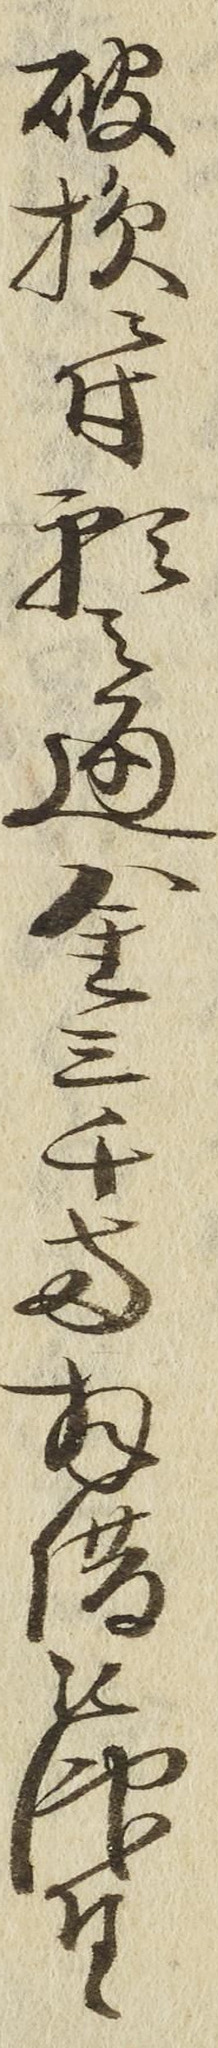破損二付願之通金三千両拝借被仰付候
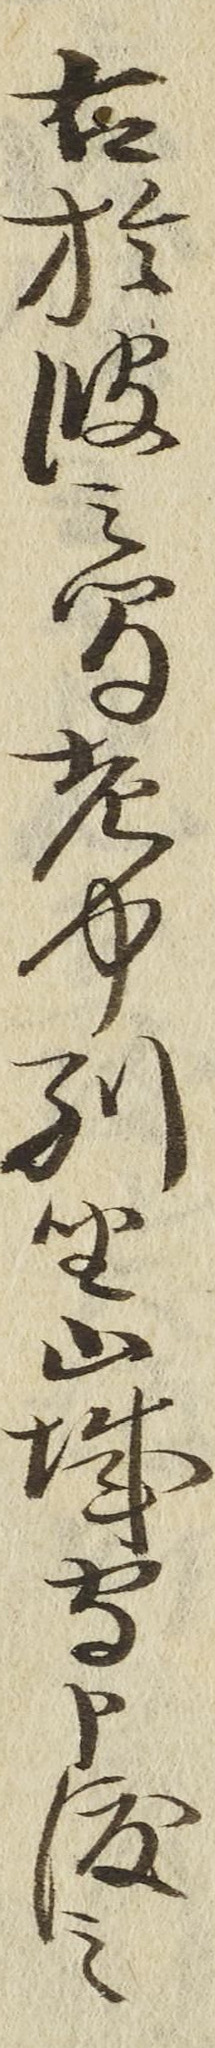右於波之間老中列座山城守申渡之
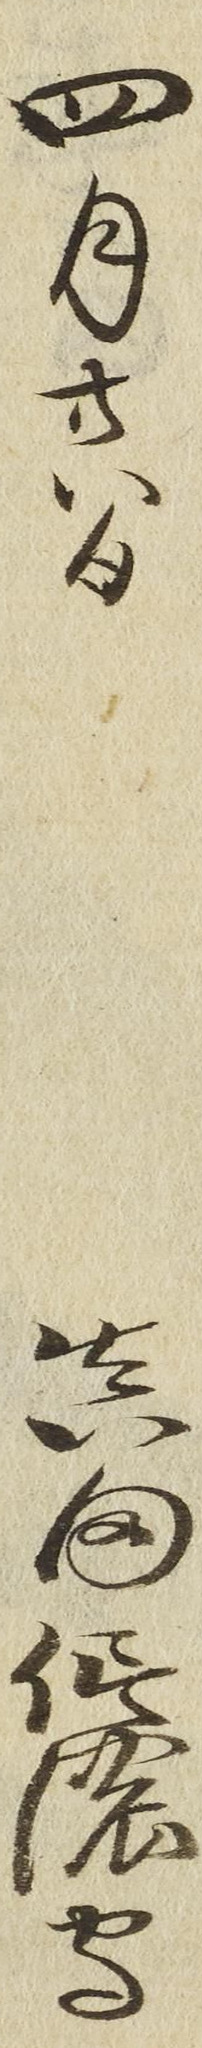四月廿八日真田信濃守
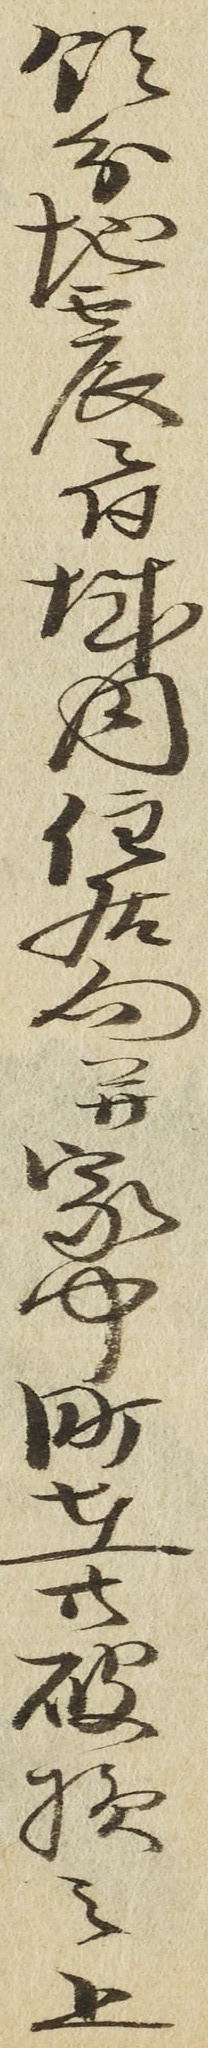領分地震二付城内住居向并家中町在共破損之上
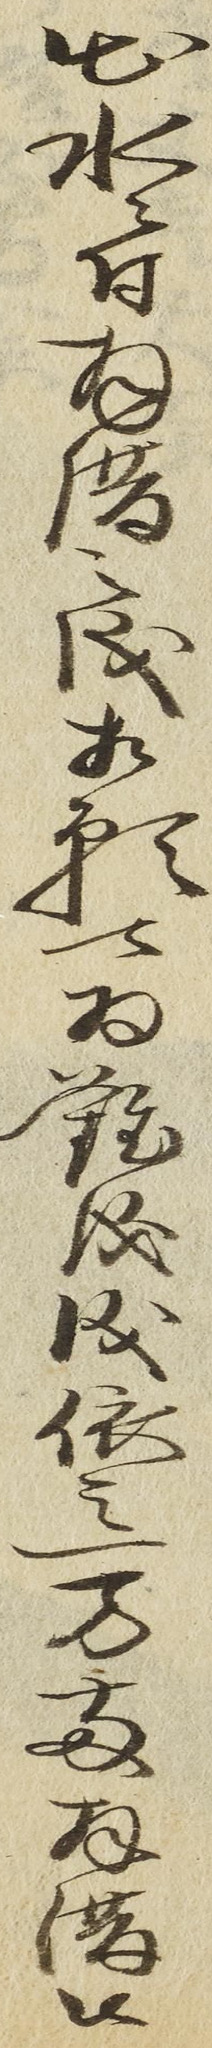出水二付拝借之儀相願可為難儀儀依之一万領拝借被
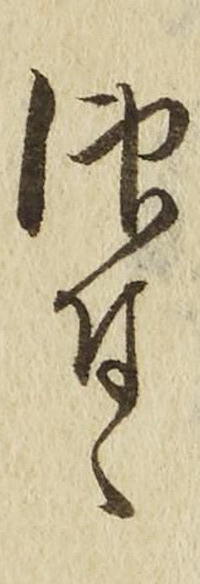仰付候
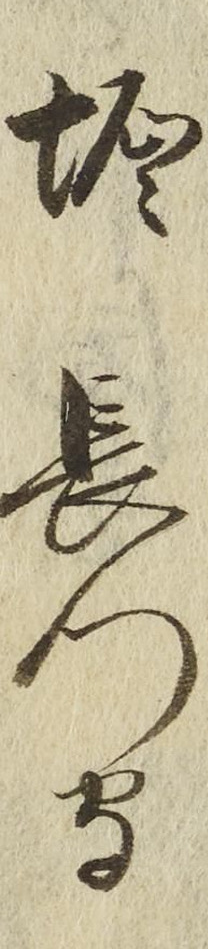堀長門守
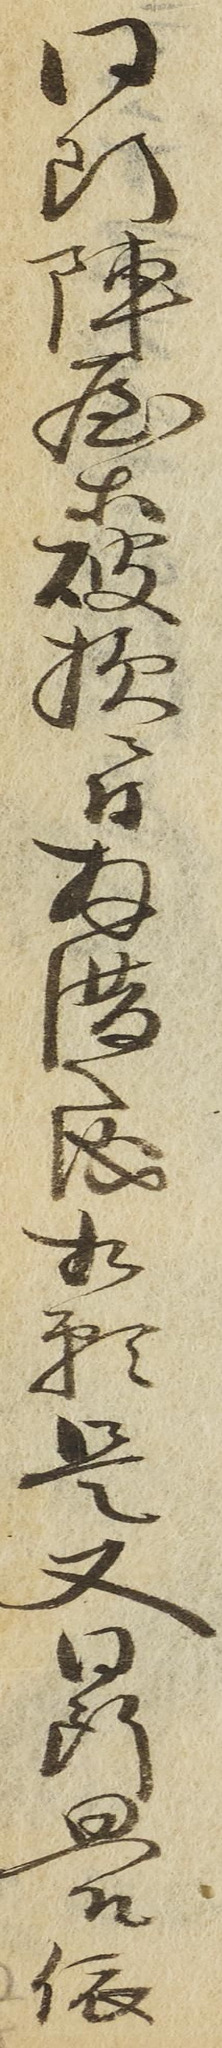同断陣屋等破損二付拝借之儀相願是又同断思召依

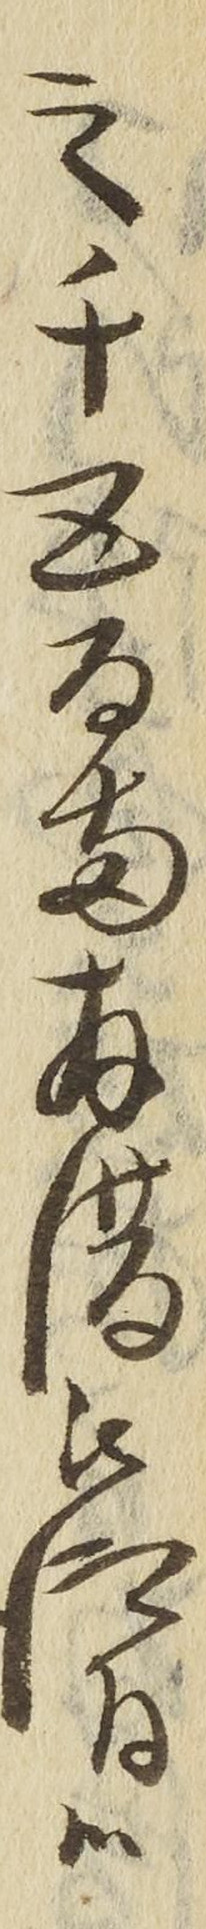之千五百両拝借被仰付候
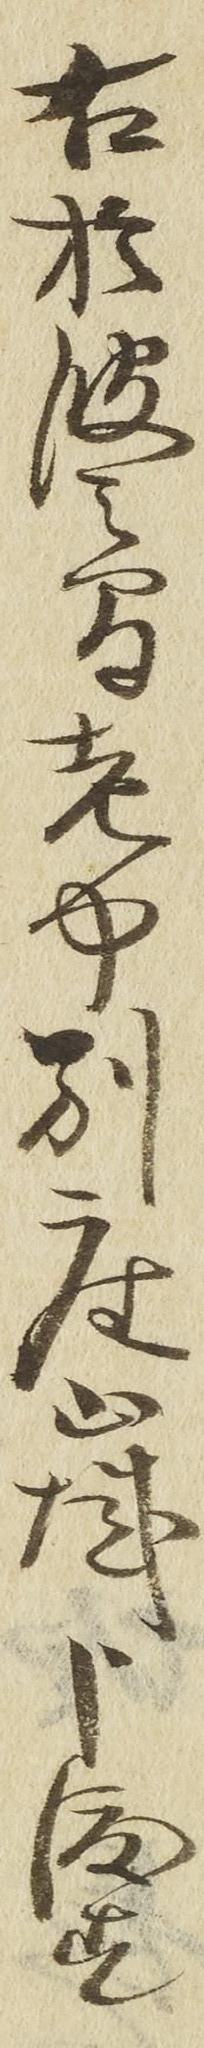右於波之間老中列座山城申渡奉候
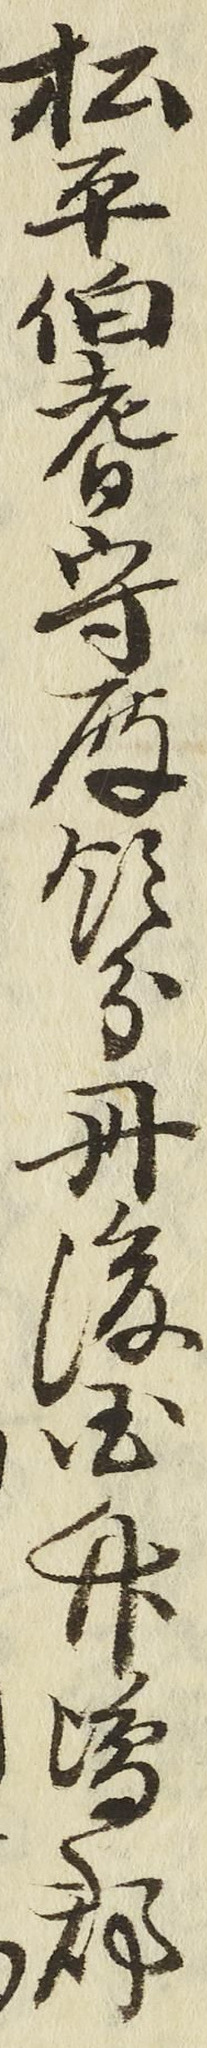松平伯耆守殿領分丹後国竹嶋郡
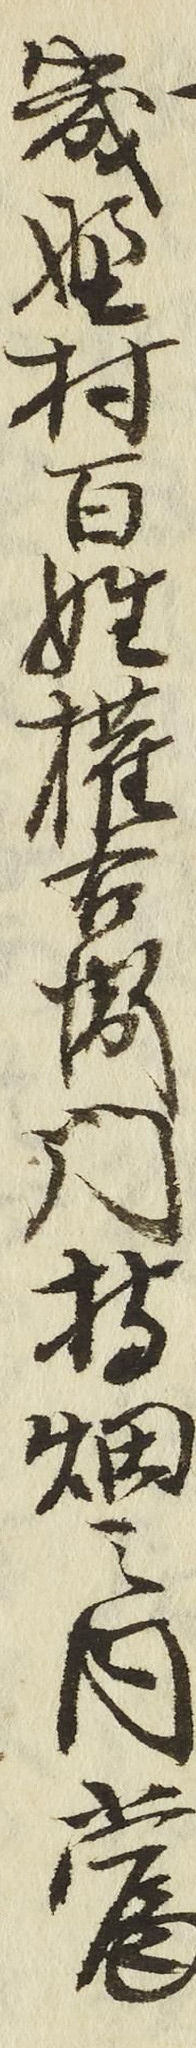幾野村百姓権右衛門持畑の内当
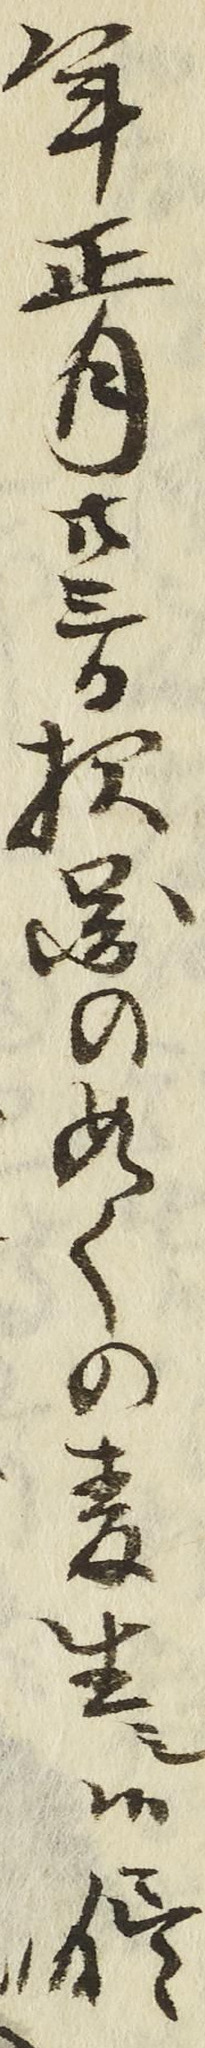年正月廿三日夜図の如くの麦生ㇱ候儘
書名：信濃國大地震記　乾
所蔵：東京大学地震研究所図書室 Earthquake Research Institute Library, The University of Tokyo, JAPAN
